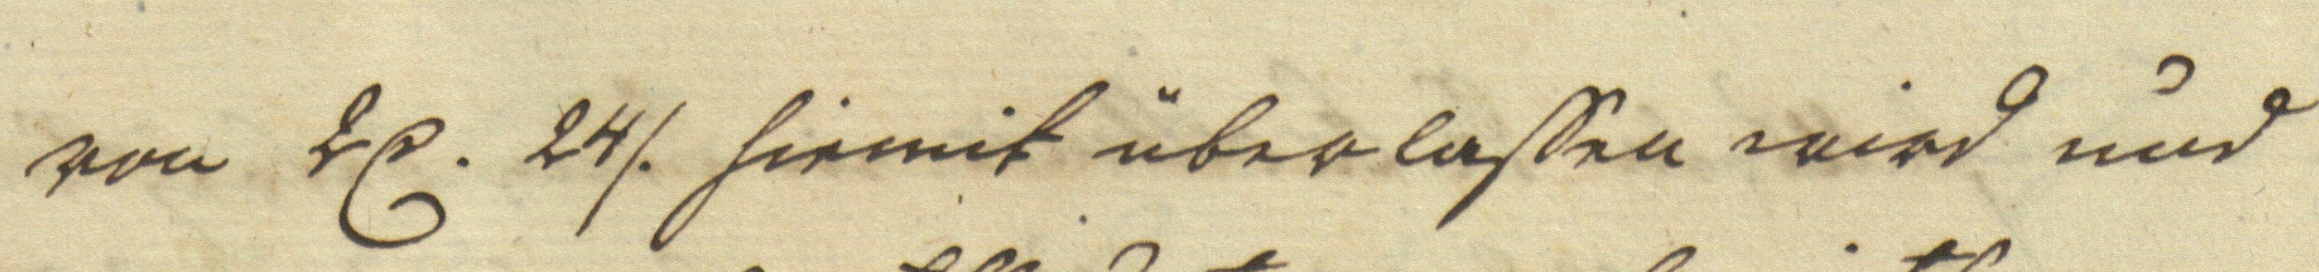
von 2 l. 24 s. hiemit überlassen wird und
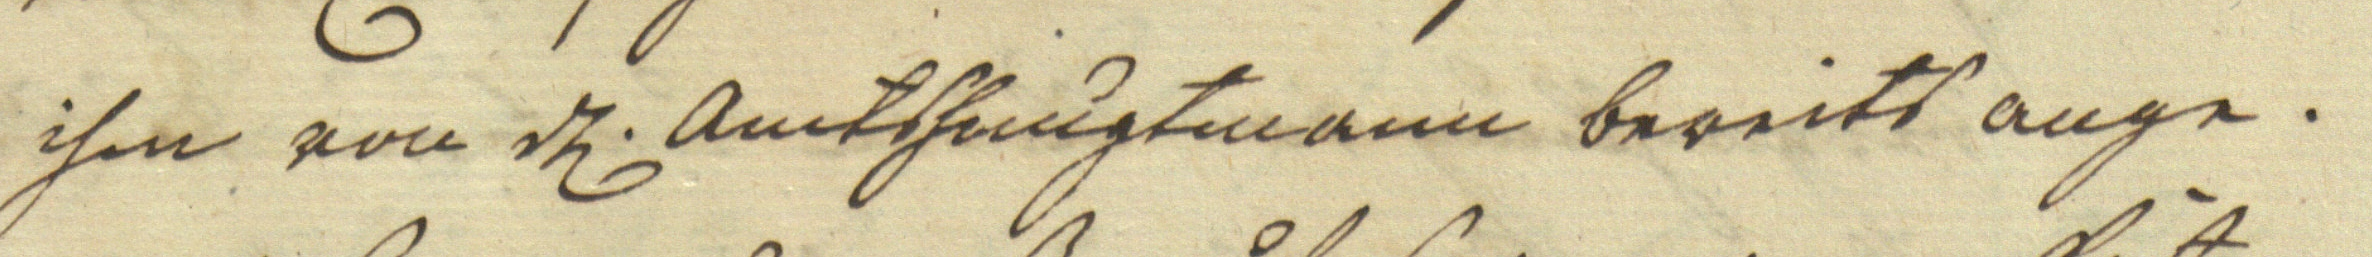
ihm von dh. Amtshauptmann bereits ange¬
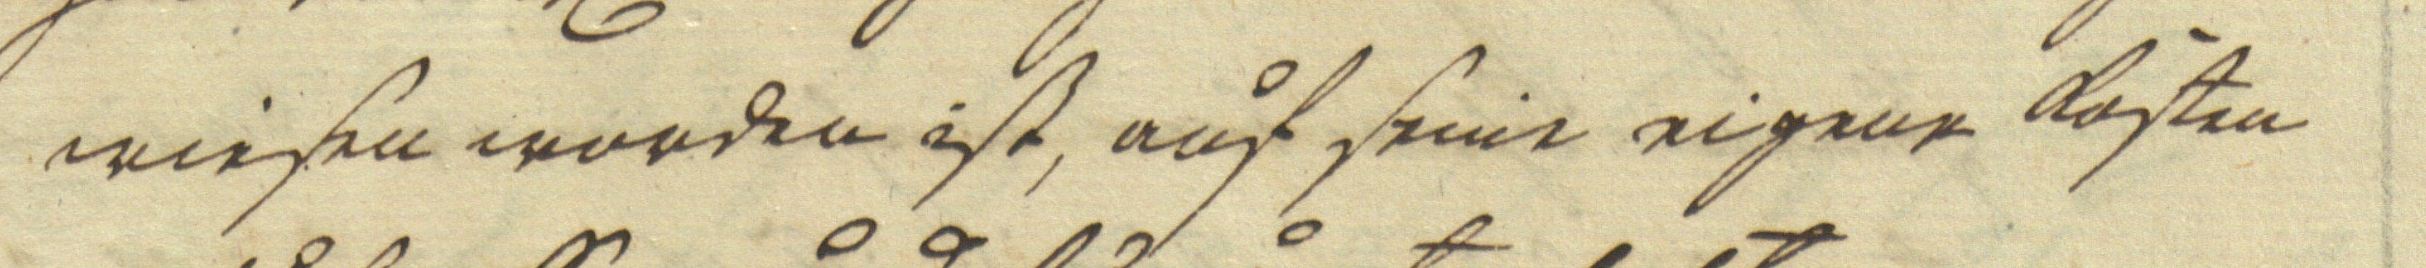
wiesen worden ist, auf seine eigene Kosten
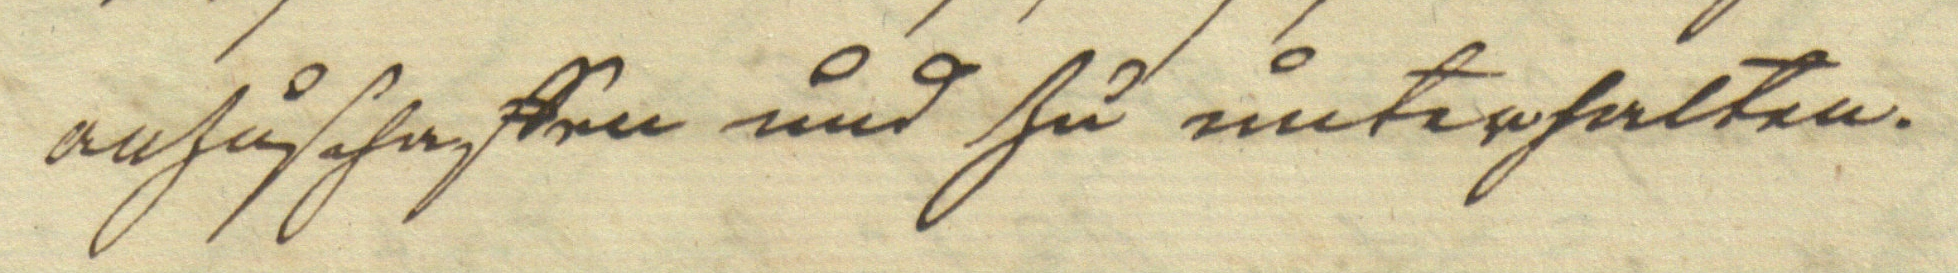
anzuschaffen und zu unterhalten.
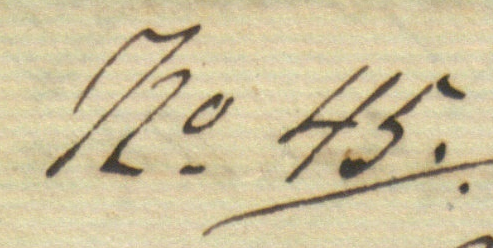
No 45.
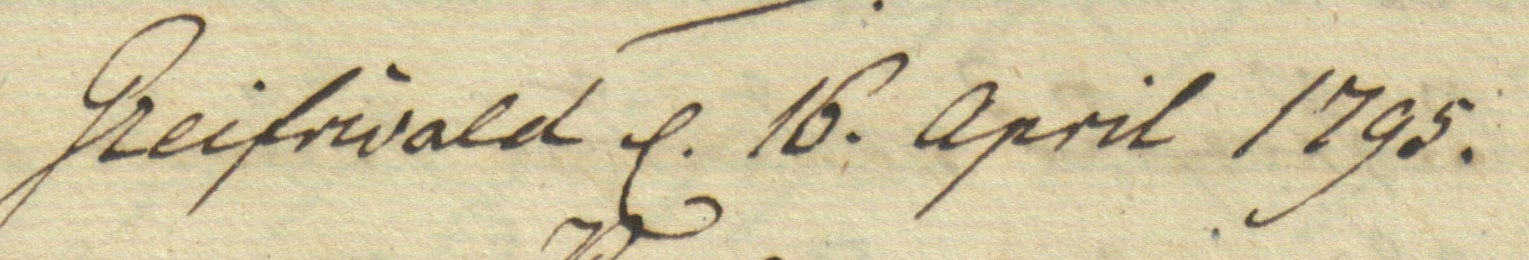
Greifswald d. 16. April 1795.
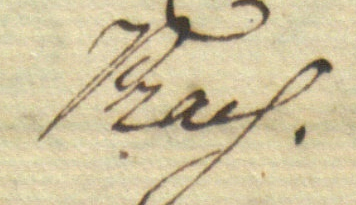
Praes.
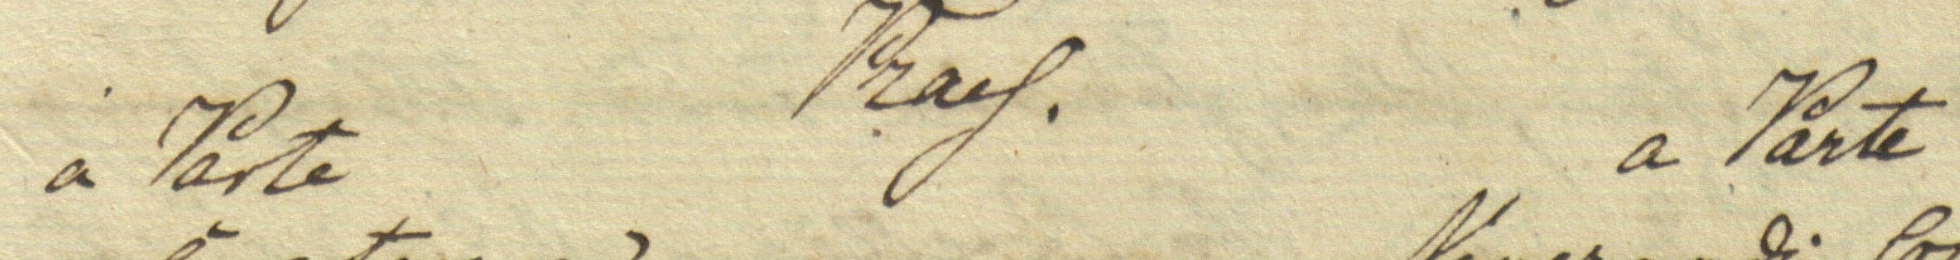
a Parte a Parte
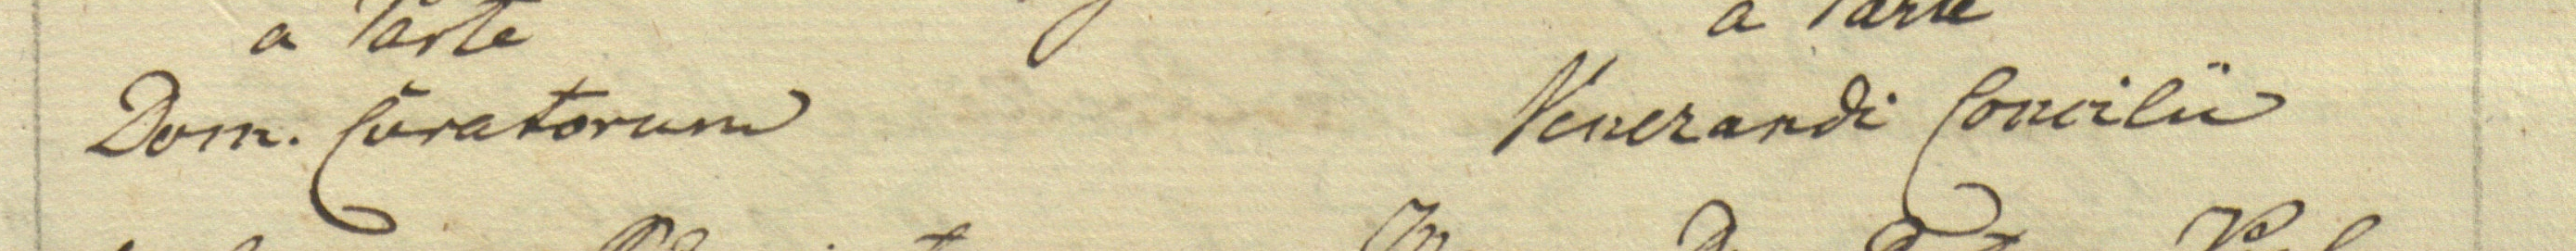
Dom. Caratorum Venerandi Concilii
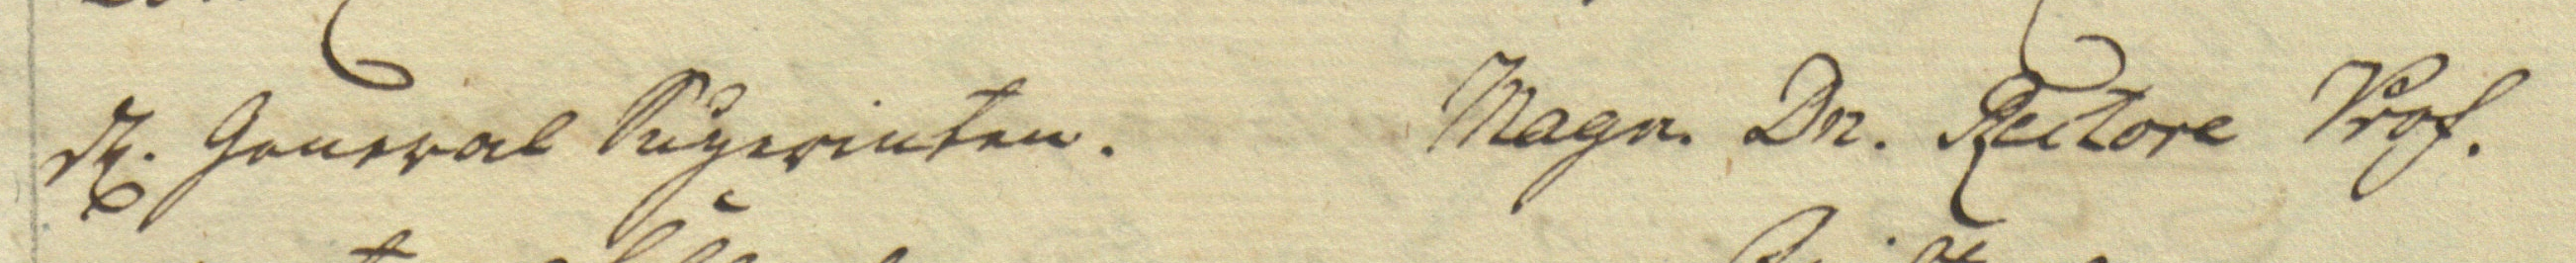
dh. General Superinten¬ Magn. Dn. Rectore Prof.
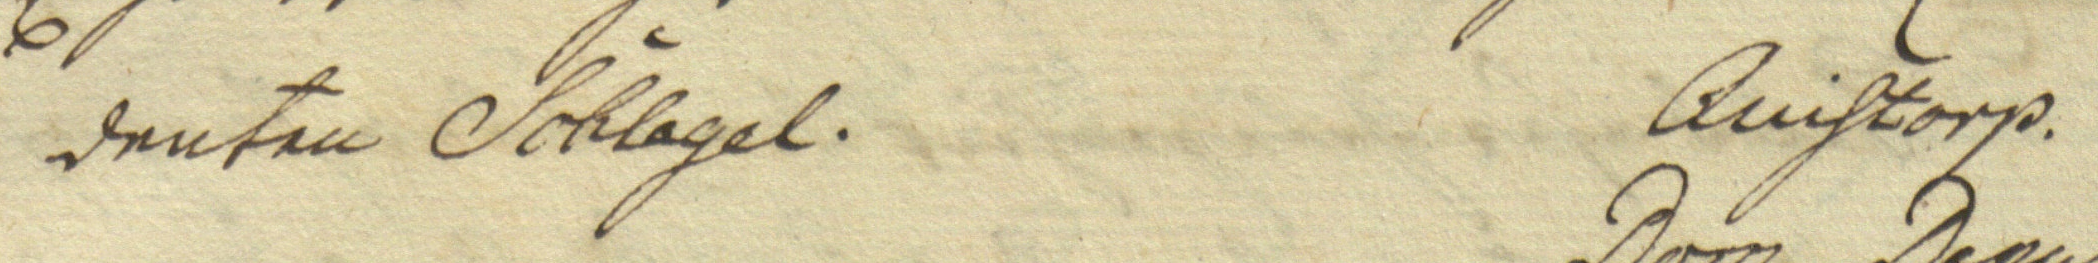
denten Schlegel. Quistorp
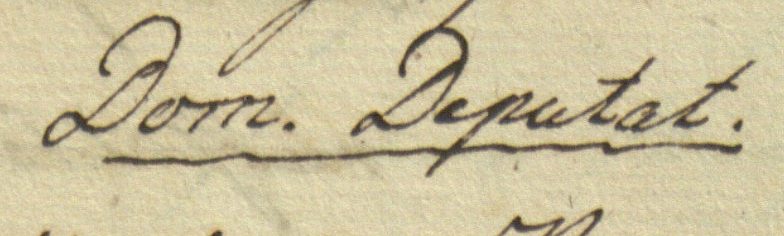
Dom. Deputat.
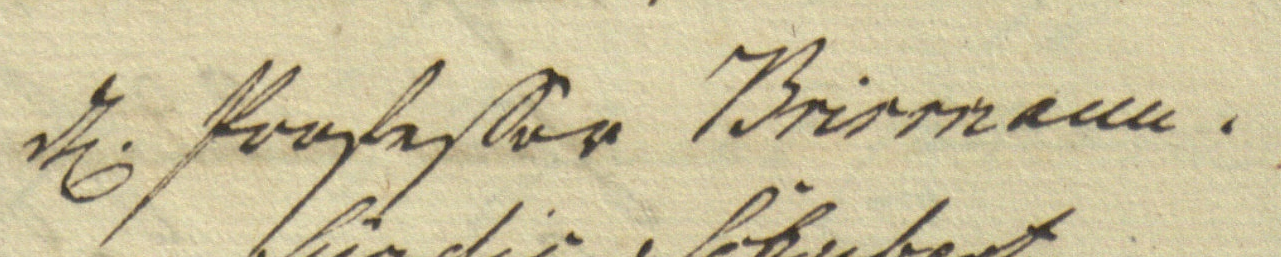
dh. Professor Brismann.
